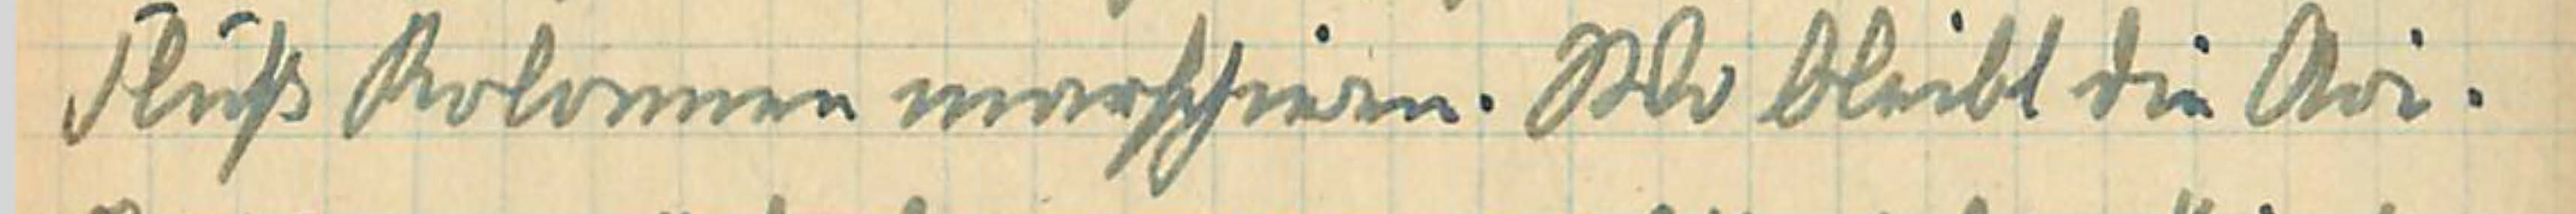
Fluß Kolonnen marschieren. Wo bleibt die Ari.
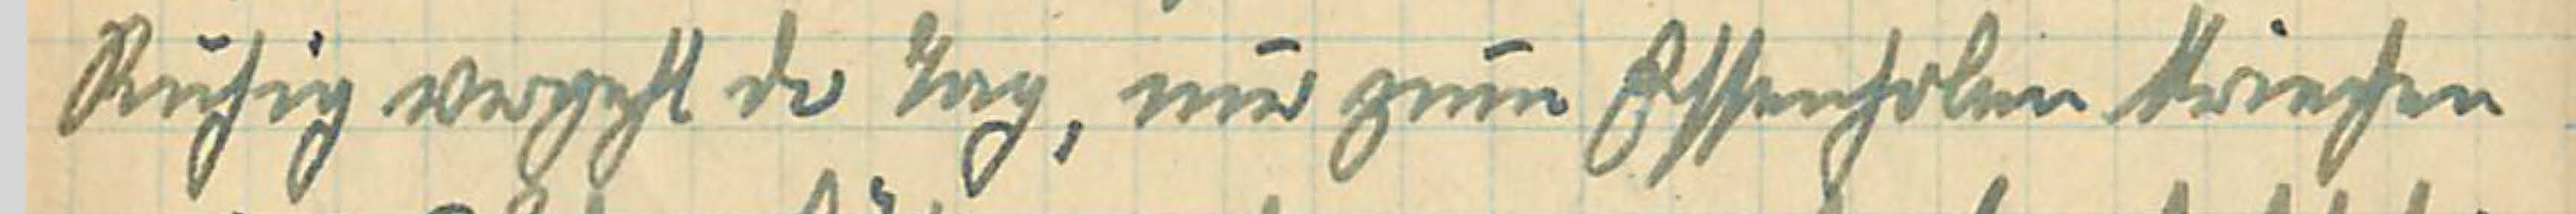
Ruhig vergeht der Tag, nur zum Essenholen kriechen
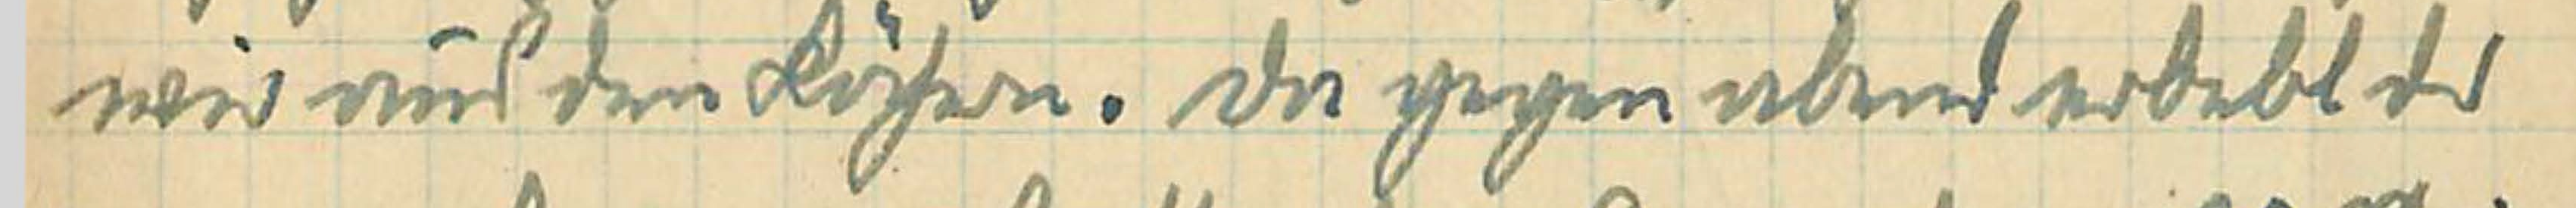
wir aus den Löchern. Da gegen abend erbebt der
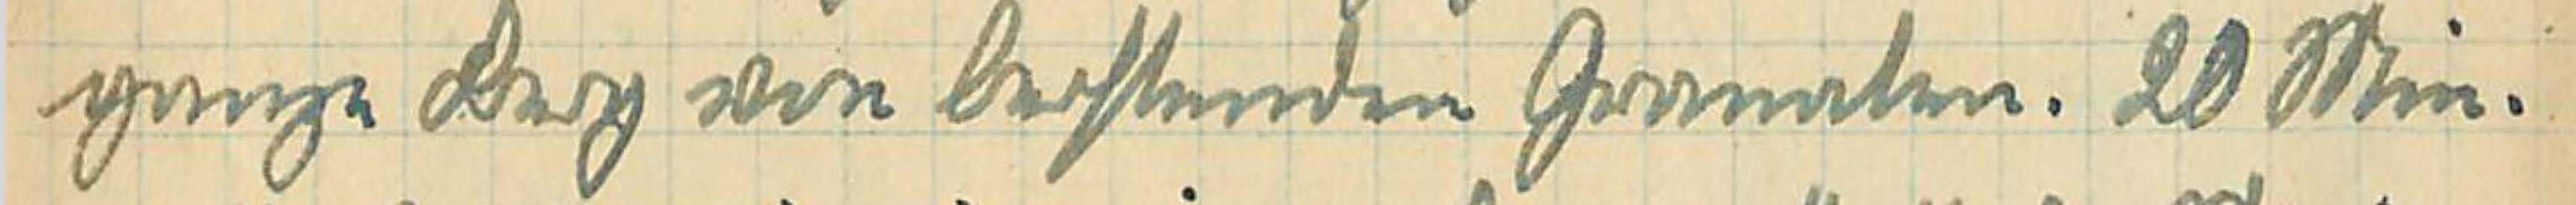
ganze Berg von berstenden Granaten. 20 Min.
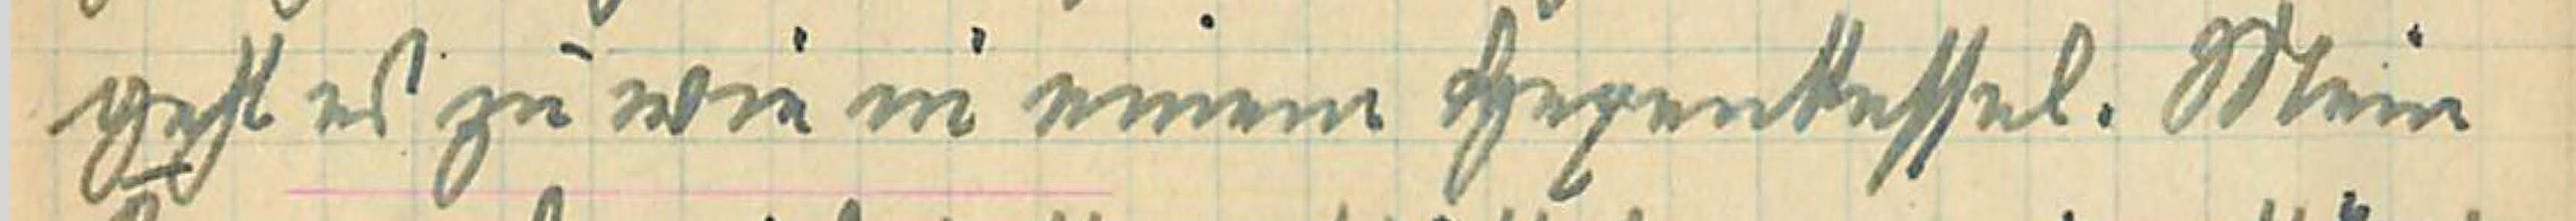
geht es zu wie in einem Hexenkessel. Mein
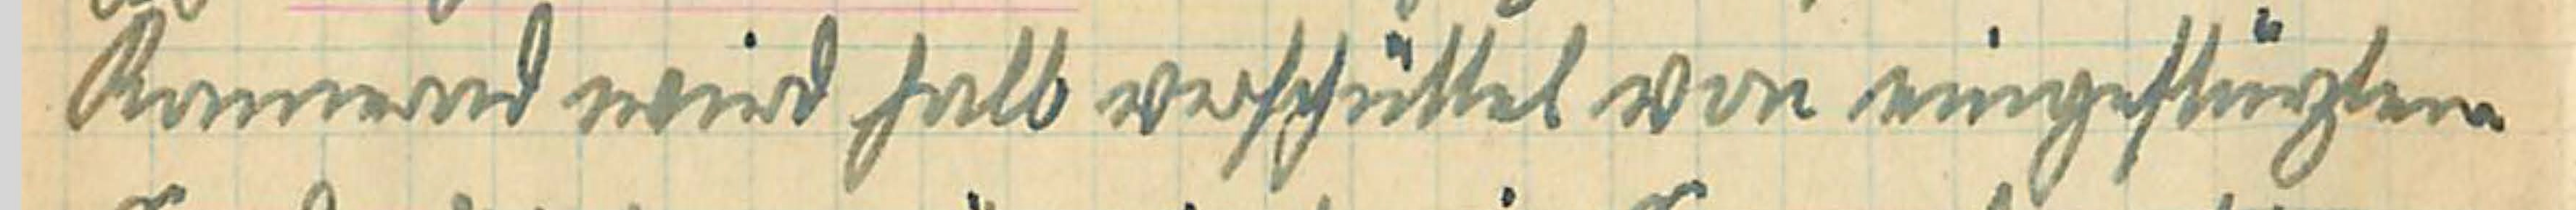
Kamerad wird halb verschüttet von eingestürztem
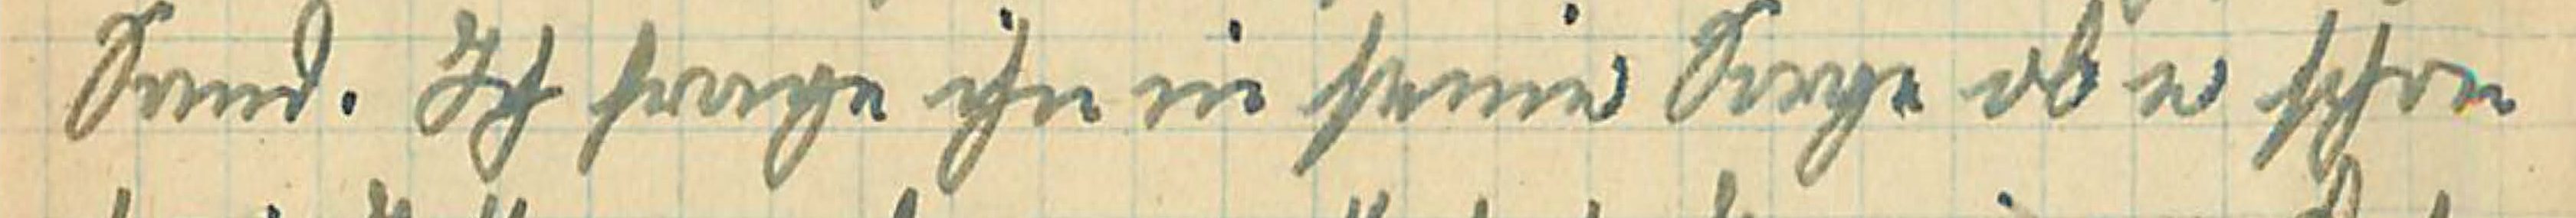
Sand. Ich frage ihn in seiner Sorge ob er schon
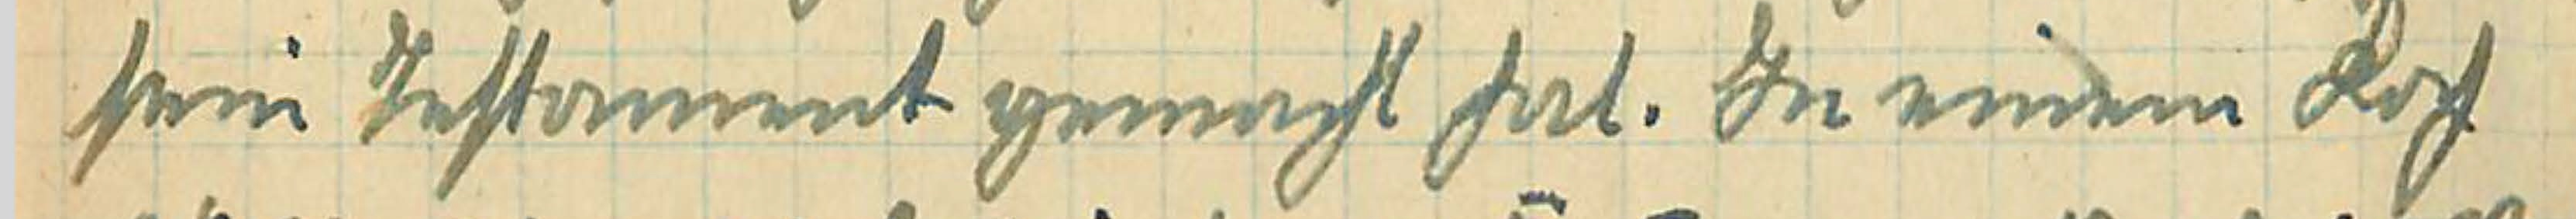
sein Testament gemacht hat. In einem Loch
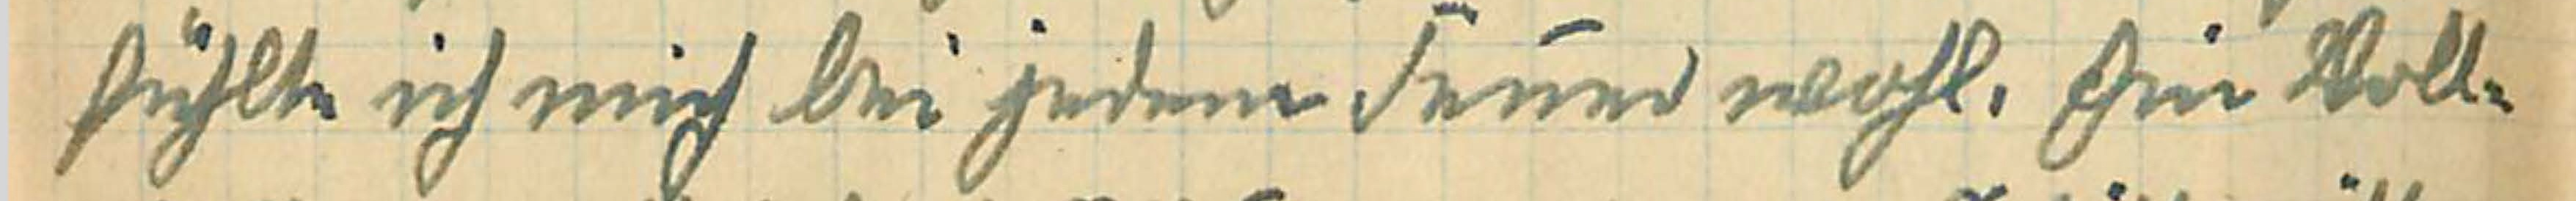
fühlte ich mich bei jedem Feuer wohl. Ein Voll-
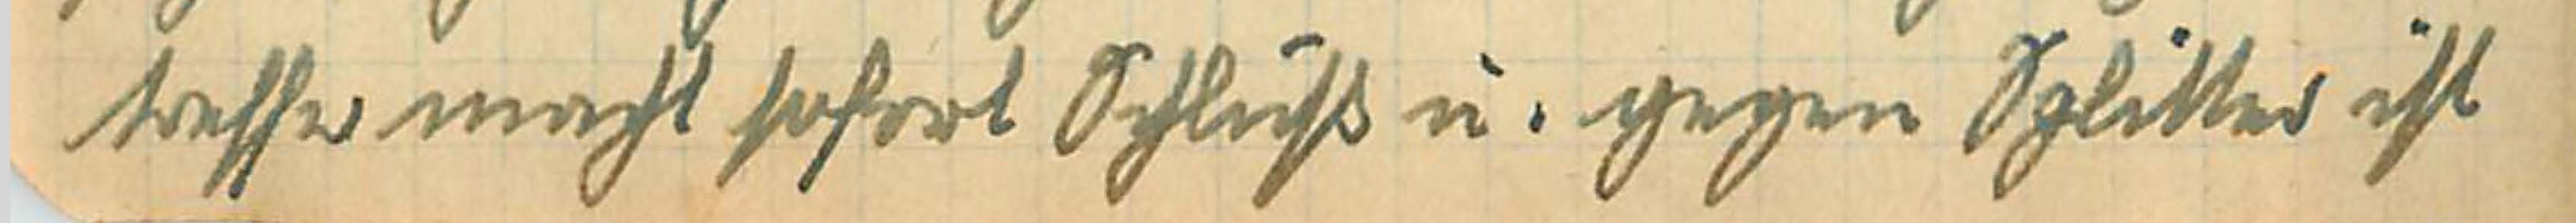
treffer macht sofort Schluß u. gegen Splitter ist
